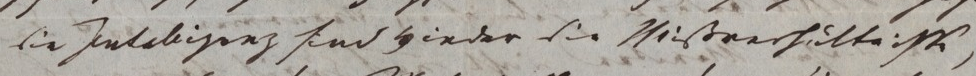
die Intelligenz sind wieder die Mißverhältnisse,
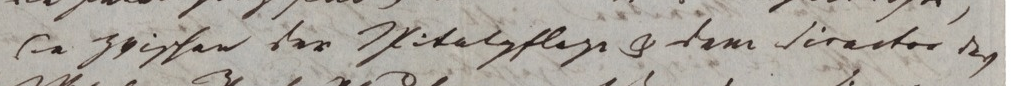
die zwischen der Spitalpflege & dem Director des
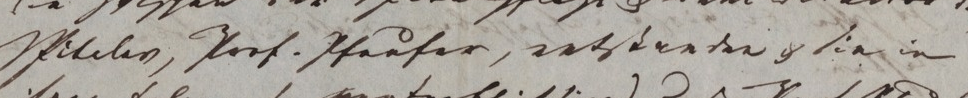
Spitales, Prof. Pfeufer, entstanden & die in
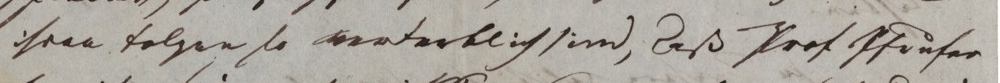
ihren Folgen so verderblich sind, daß Prof. Pfeufer
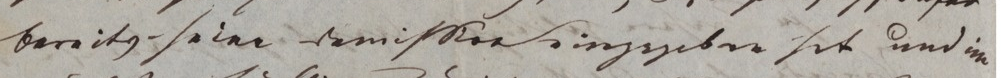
bereits seine Demission eingegeben hat und im
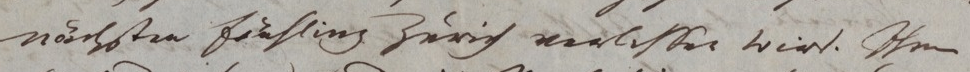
nächsten Frühling Zürich verlassen wird. Ihm
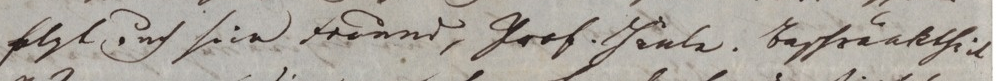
folgt auch sein Freund, Prof. Hänle. Beschränktheit
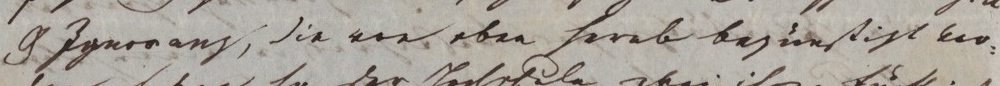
& Ignoranz, die von oben herab begünstigt wer-
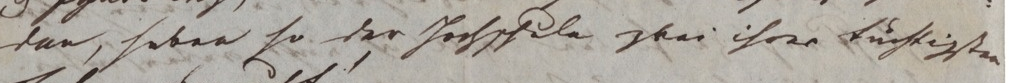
den, haben so der Hochschule zwei ihrer tüchtigsten
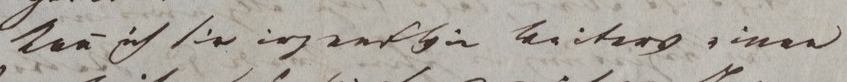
Kann ich Dir irgendwie weiters einen
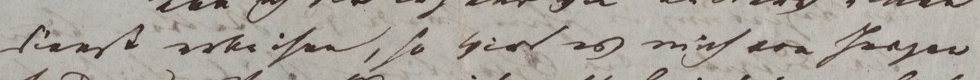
Dienst erweisen, so wird es mich von Herzen
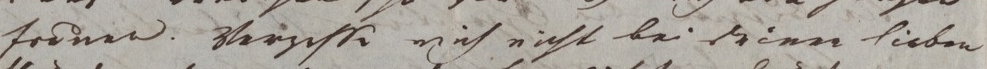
freuen. Vergesse mich nicht bei Deinen lieben
